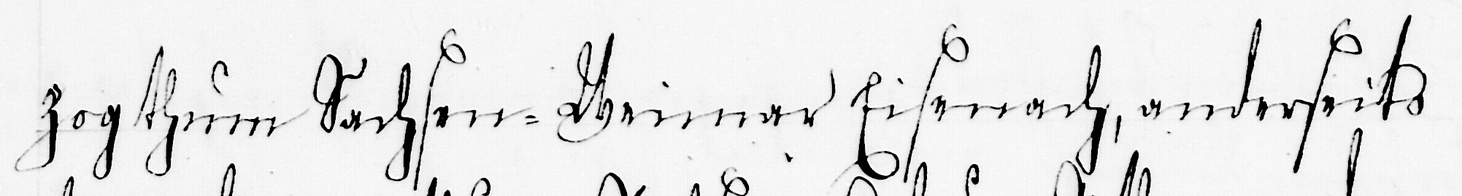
zogthum Sachsen-Weimar Eisenach, anderseits
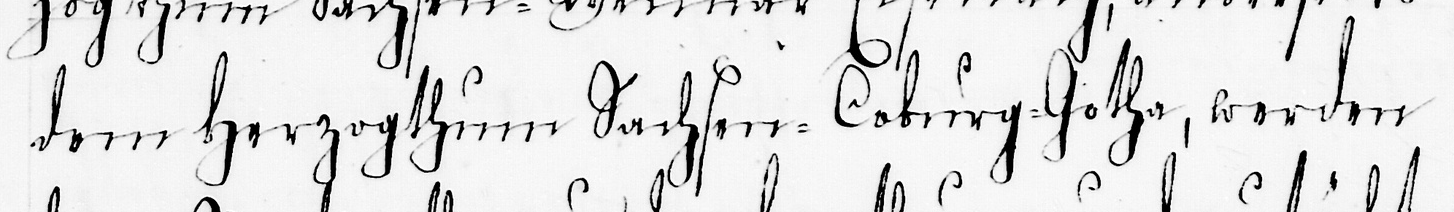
dem Herzogthum Sachsen-Coburg-Gotha, werden
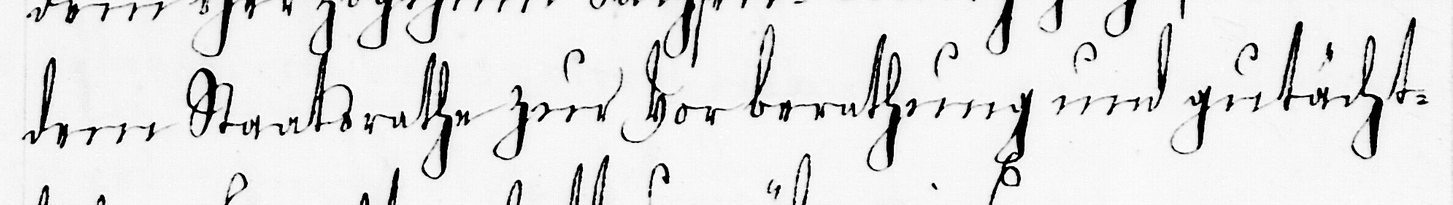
dem Staatsrathe zur Vorberathung und gutächt¬
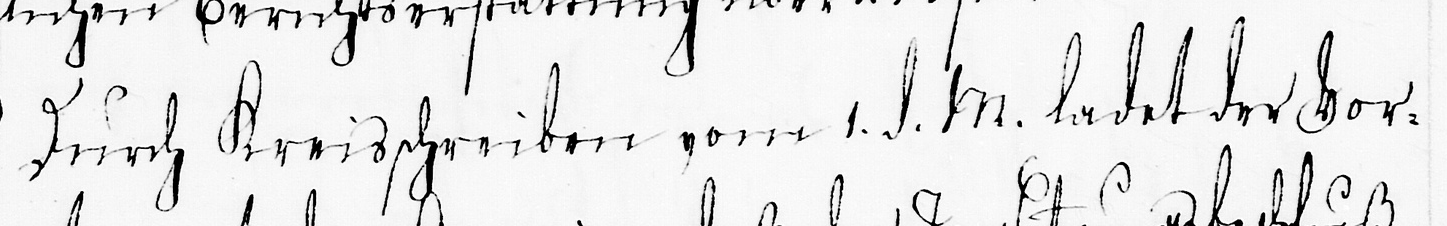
Durch Kreisschreiben vom 1. d. M. ladet der Vor¬
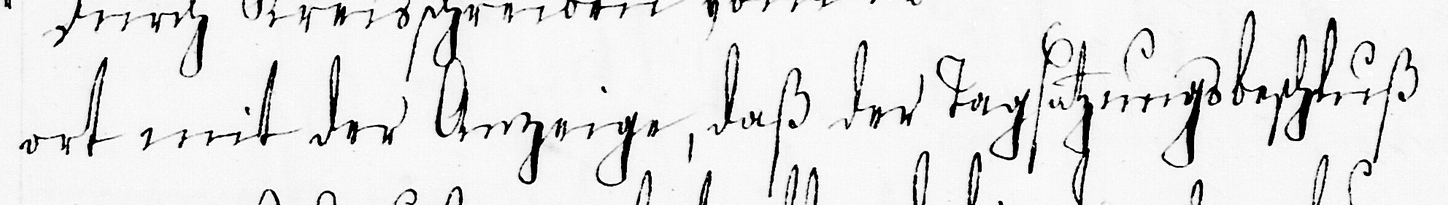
ort mit der Anzeige, daß der Tagsatzungsbeschluß
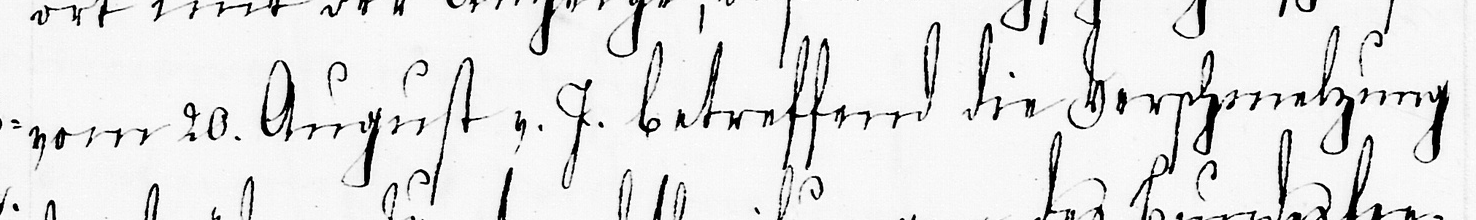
vom 20. August v. J. betreffend die Verschmelzung
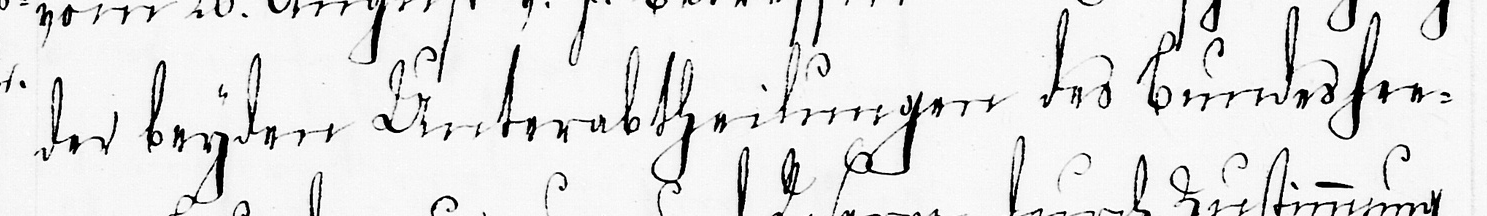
der beyden Unterabtheilungen des Bundeshe¬
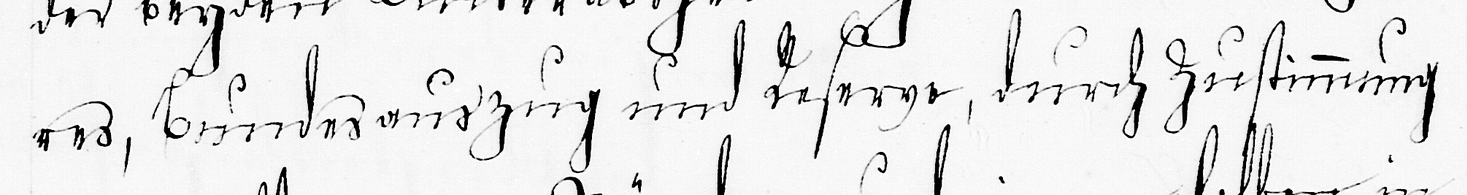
eres, Bundesauszug und Reserve, durch Zustimmung
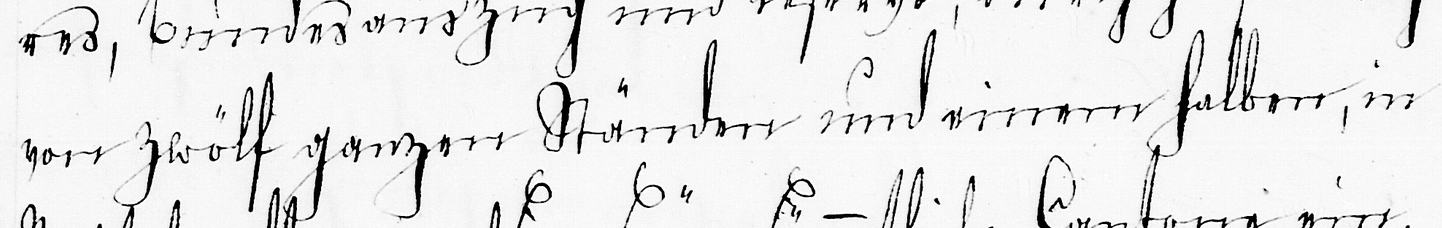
von zwölf ganzen Ständen und einem halben, in
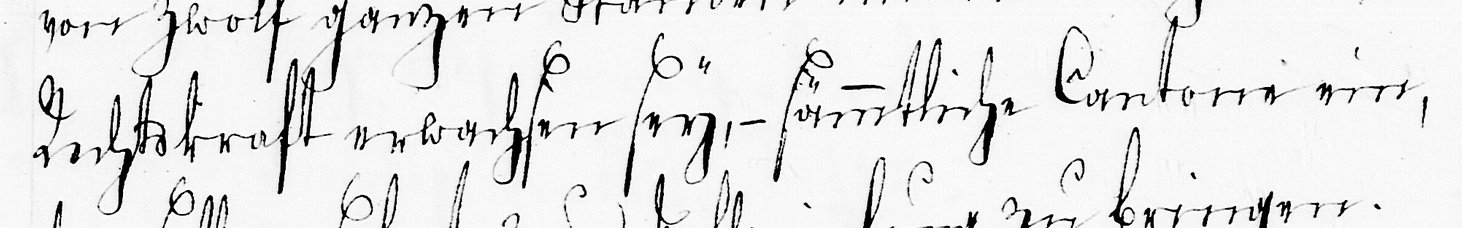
Rechtskraft erwachsen sey, – sämmtliche Cantone ein,
